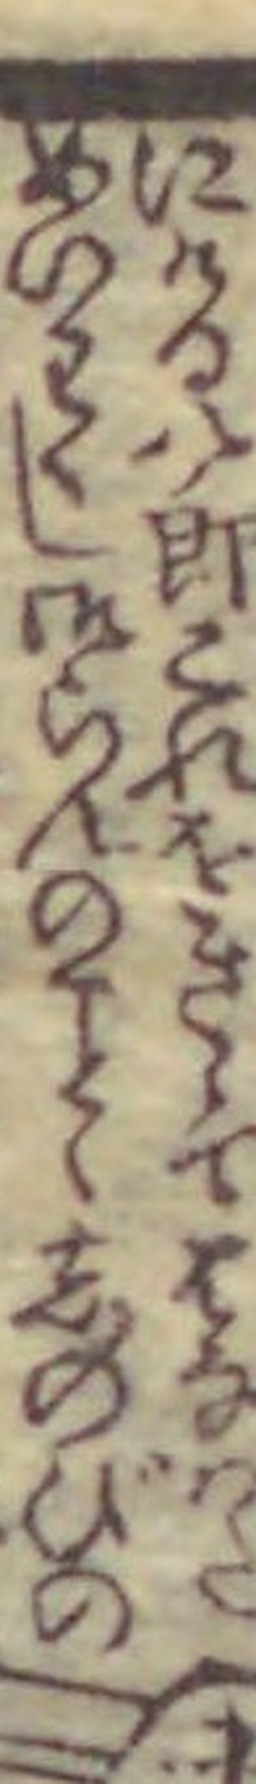めいわくし御らんのことくしのびの
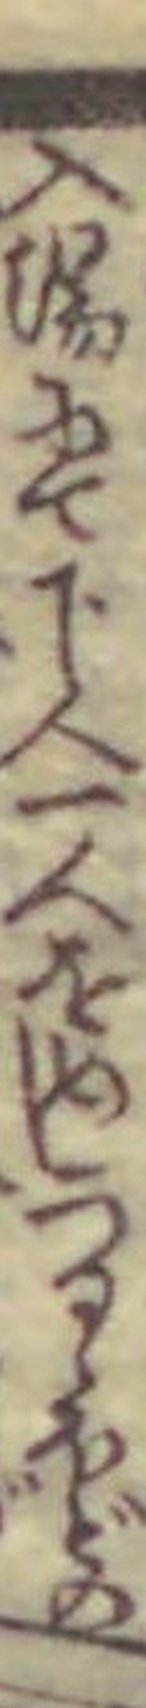入湯にて下人一人をめしつるゝほどの
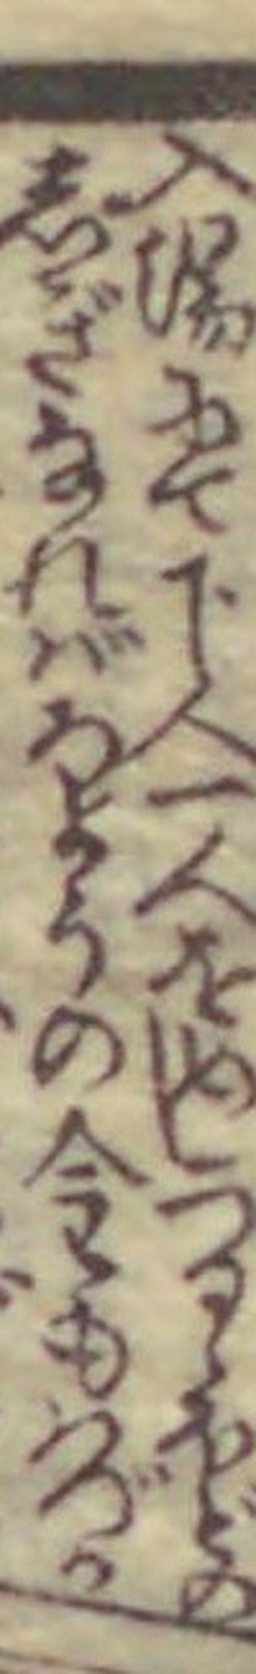じぎなればかようの金もはづか
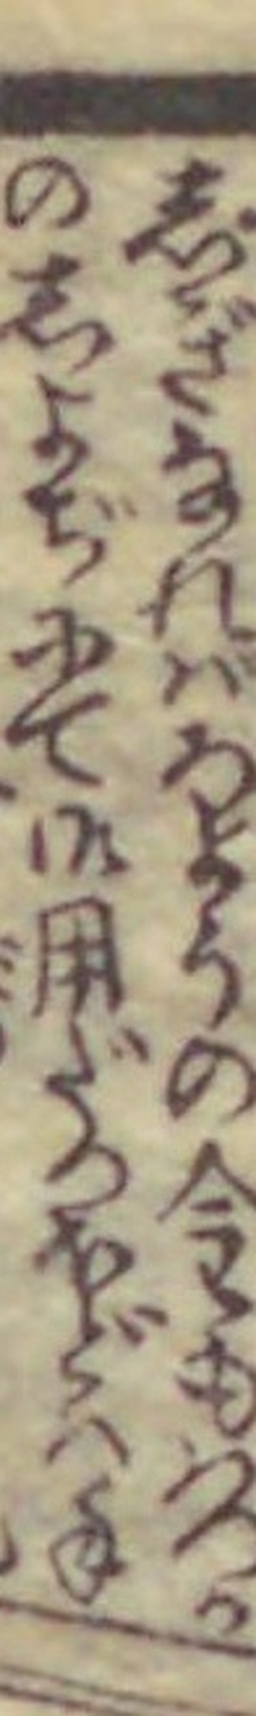のしよぢにて御用だつほどは手
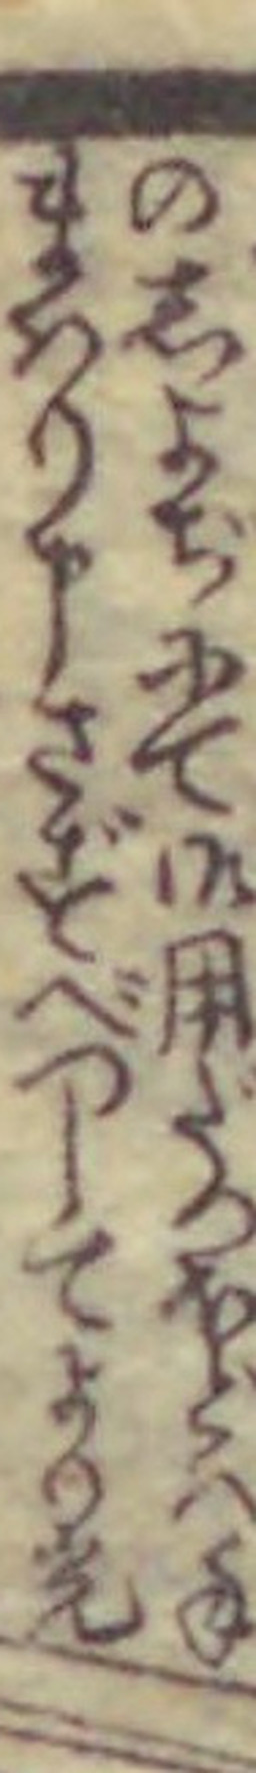まはり申さずべつしてより光
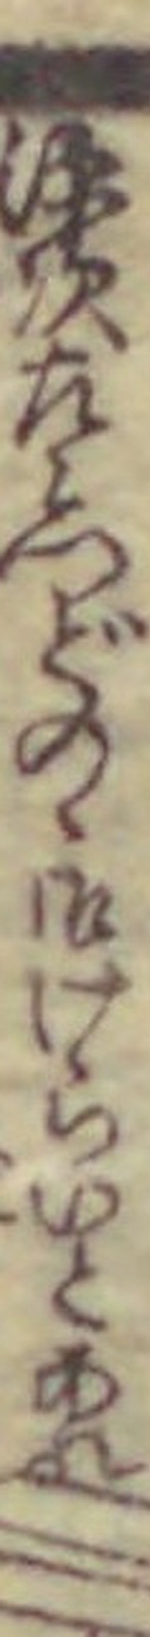源次左衛門どのゝ御けらいとあれ
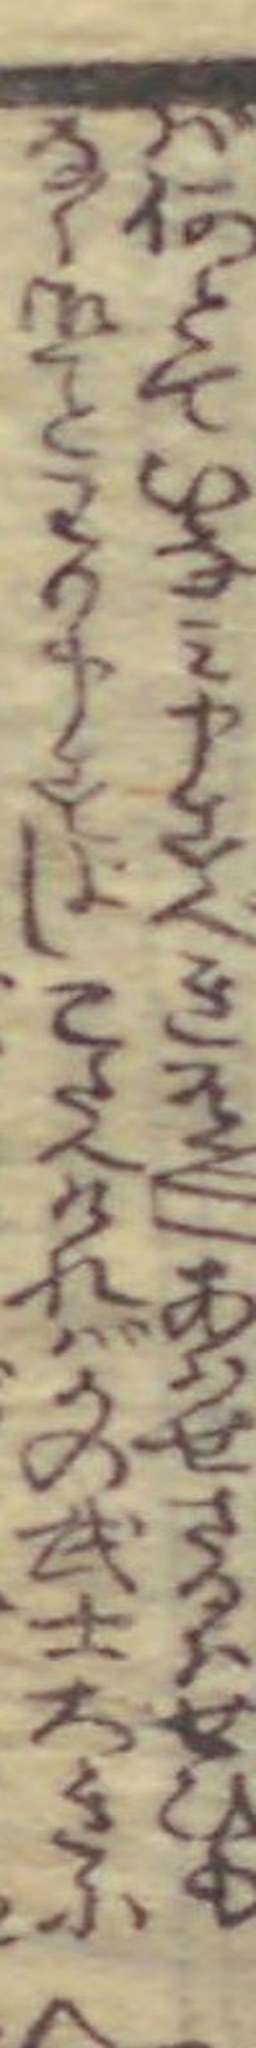なく御ことわり申すよしこたへければかの武士大きに
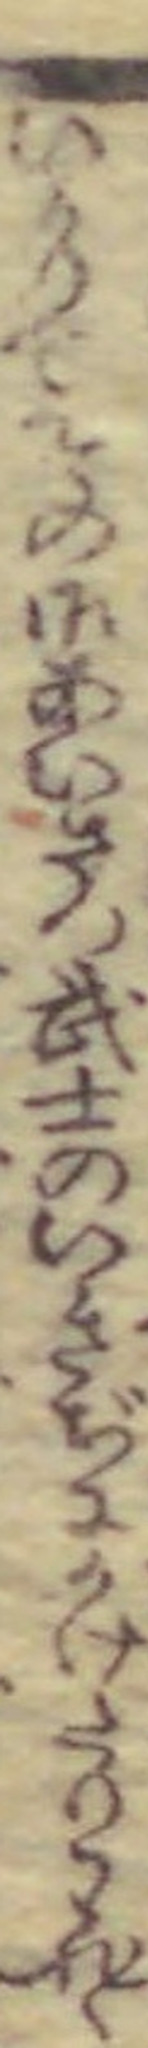いかりてその御あいさつ武士のいきぢにかけたりわれ〳〵は
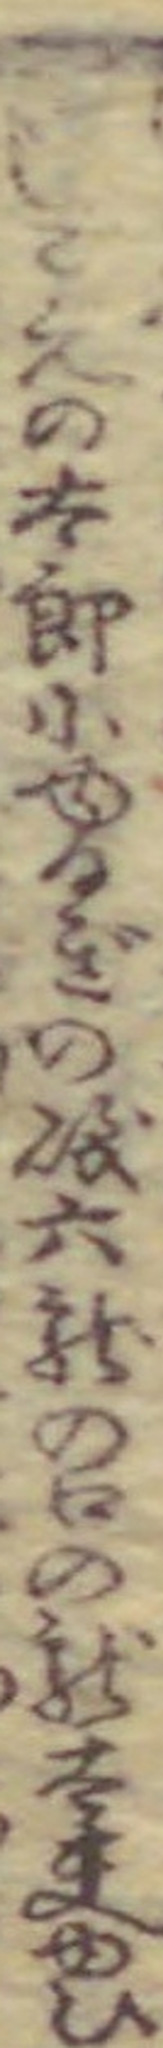こしごえの太郎小ゆるぎの磯六龍の口の龍太夫ゆひ
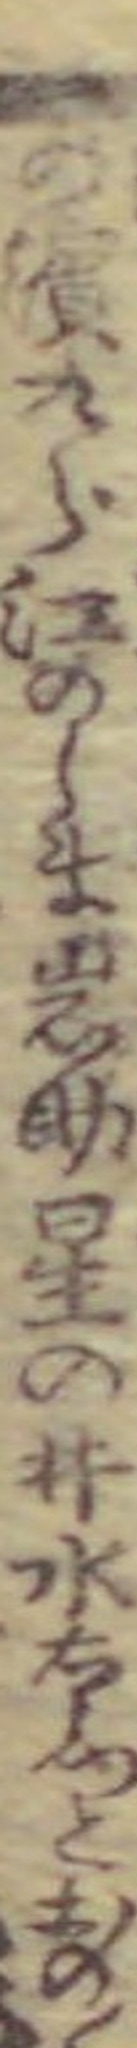の浜九郎江のしま岩助星の井水右衛門とおの〳〵
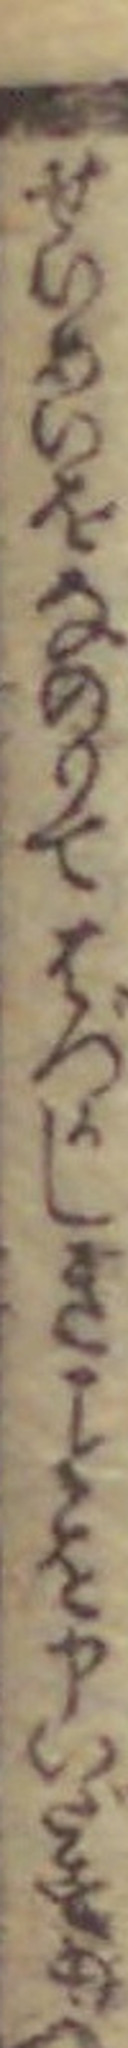せいめいをなのりてはづかしきことを申いだすも
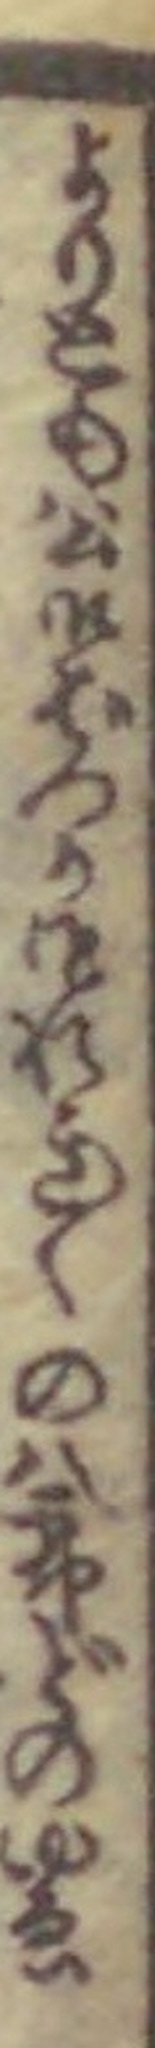よりとも公御ばつかをれき〳〵の八郎どのゆゑ
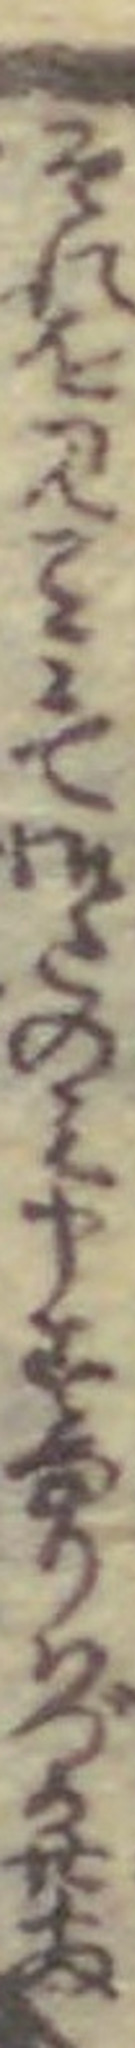それをみこみて御たのみ申すなりはづか廿両
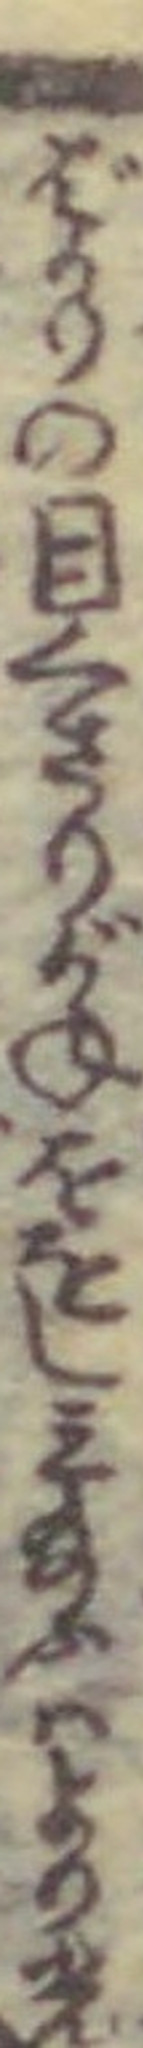ばかりの目くさりがねををしみ給ふはより光
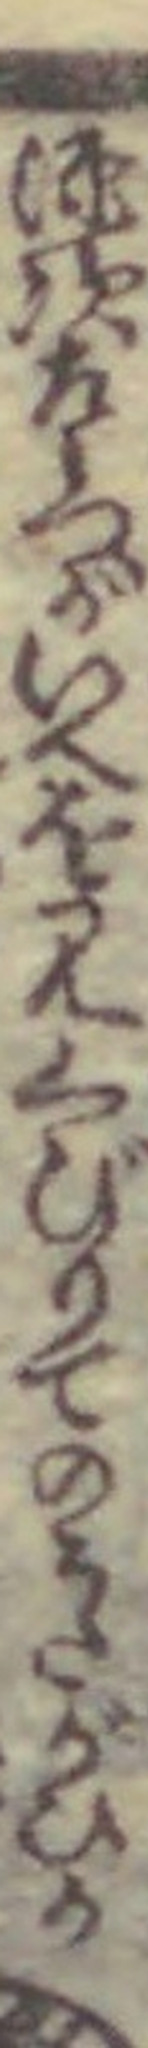源次左衛門がいへを見くびりてのうたがひか
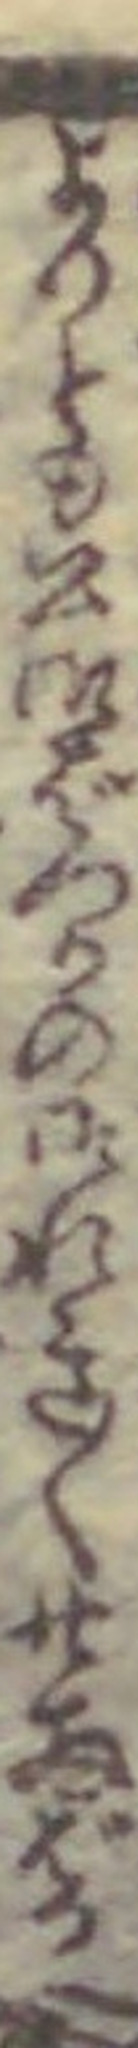よりとも公御ばつかの御れき〳〵廿両ばか
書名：八ツ目鱣因縁物語 3巻
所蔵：国立国会図書館 National Diet Library, JAPAN
